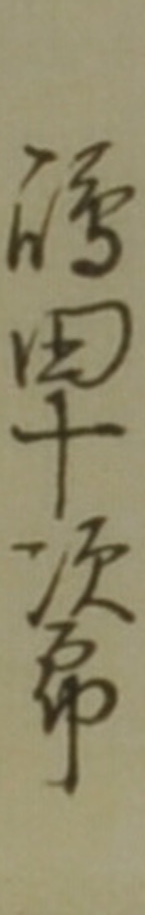嶋田十次郎
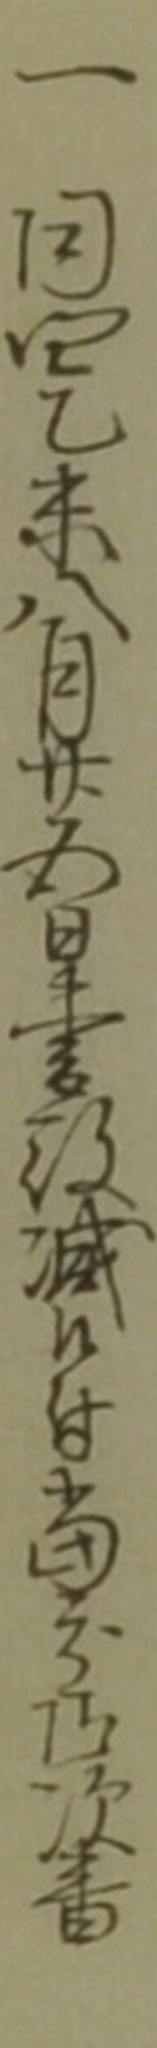一同四乙未八月廿五日書役減候付当分御次番
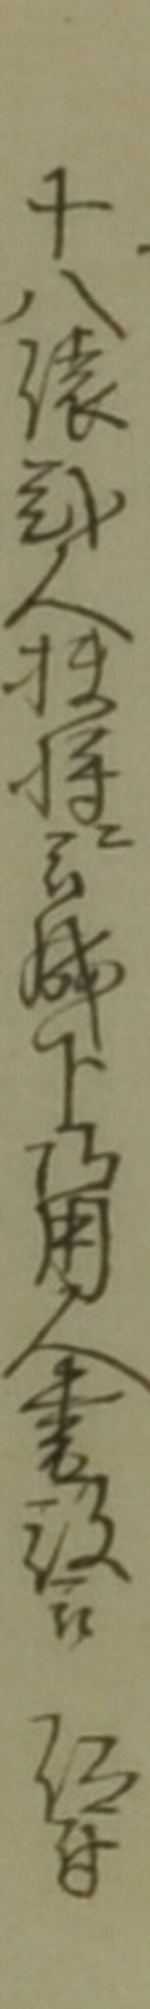十八俵弐人扶持ニ被成下御用人書役被仰付
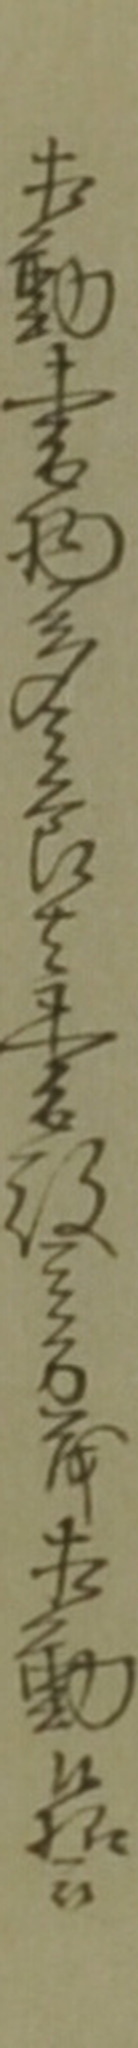相勤書物多之節者書役之方茂相勤候様被
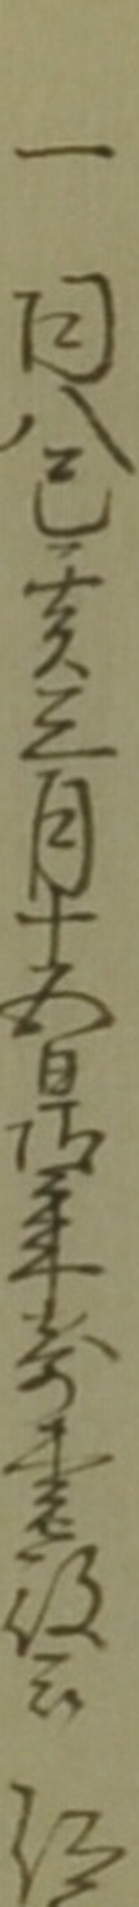一同八巳亥三月十五日御年寄書役被仰付
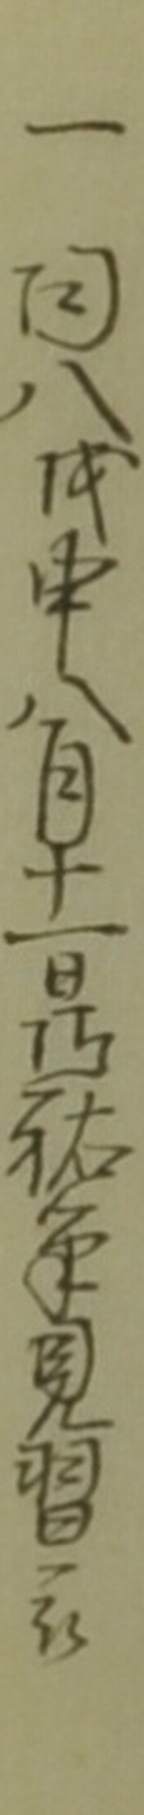一同八戊申八月十一日御祐筆見習被
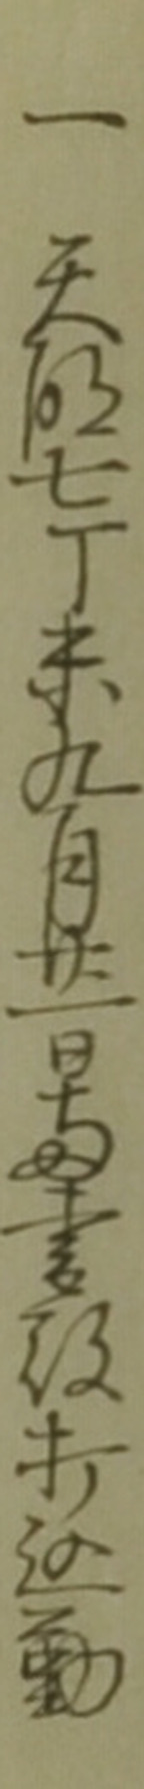一天明七丁未九月廿一日両書役打込勤

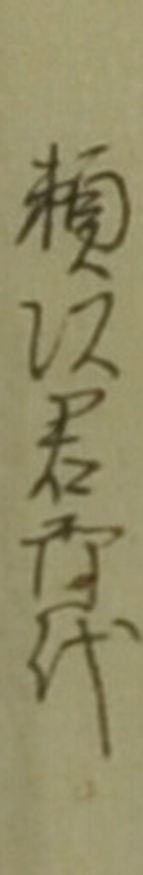頼以君御代
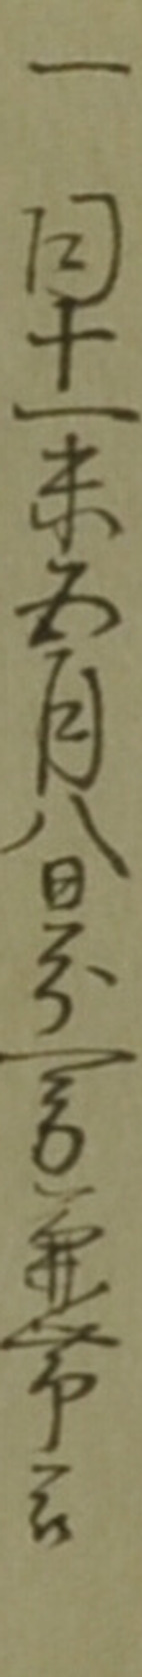一同十一未五月八日分一方兼帯被
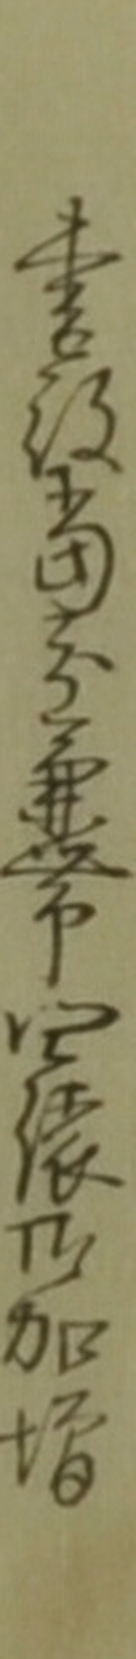書役当分兼帯四俵御加増
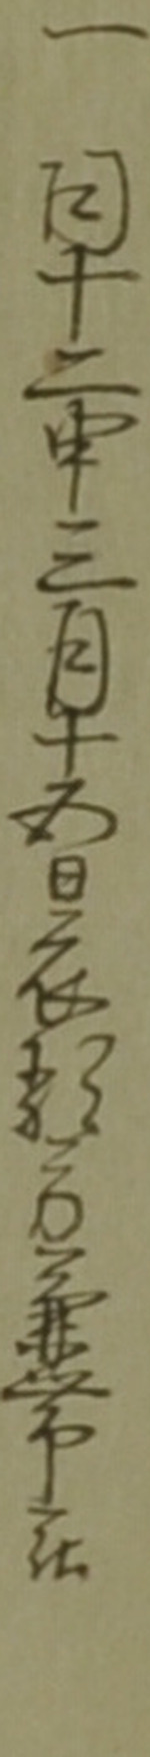一同十二申三月十五日衣類方兼帯被
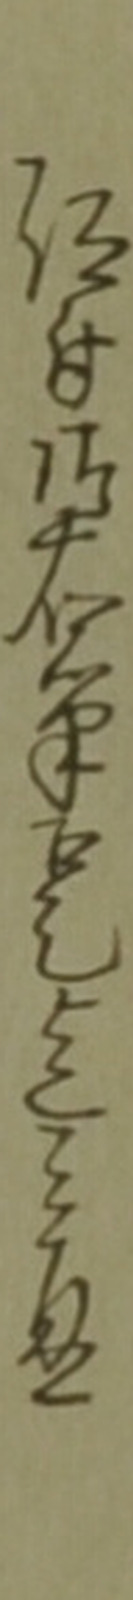仰付御右筆是迄之通
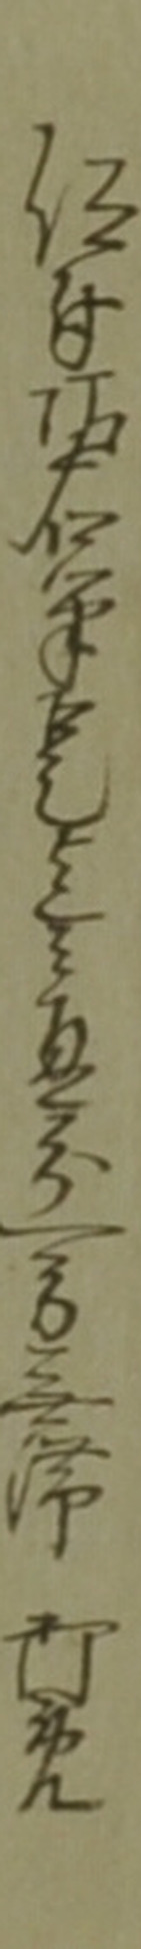仰付御右筆是迄之通分一方無滞御免
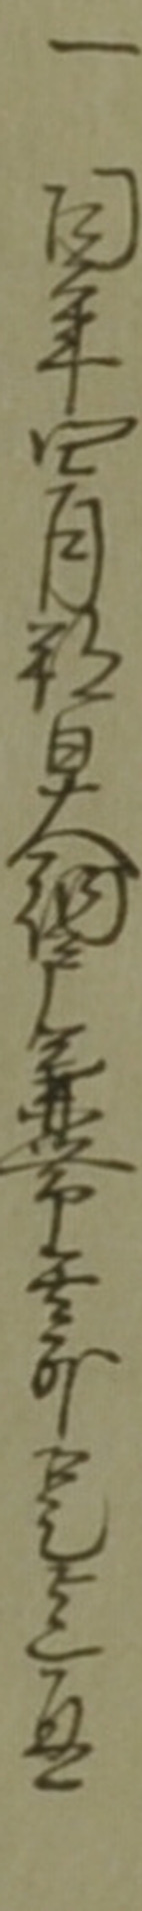一同年四月朔日大納戸兼帯其外是迄之通
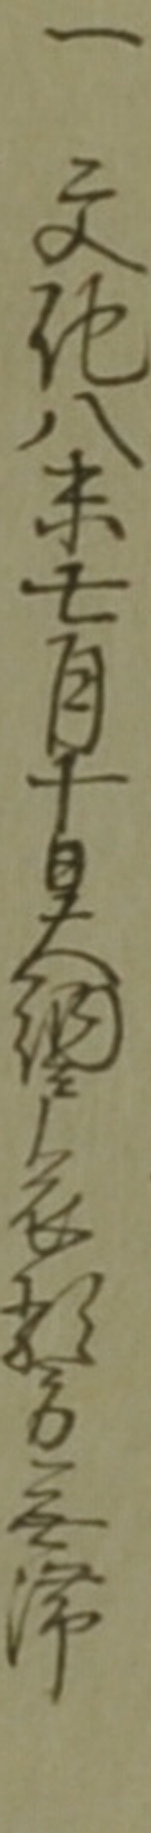一文化八未七月十日大納戸衣類方無滞
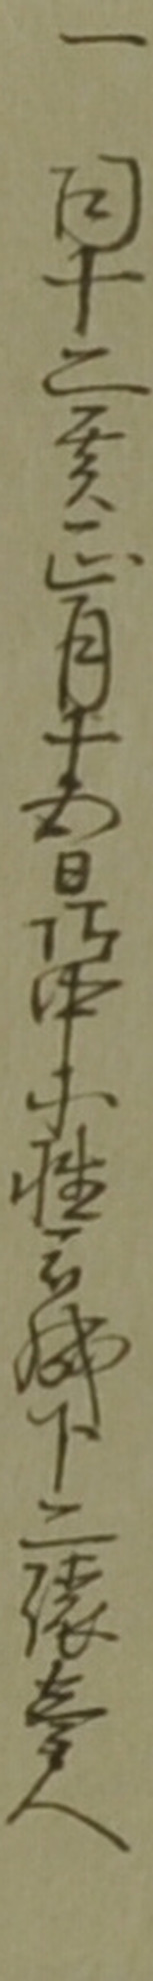一同十二亥正月十五日御中小性被成下二俵壱人
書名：無足諸士勤仕録（五）
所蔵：伊那市立高遠町図書館・合同会社AMANE
